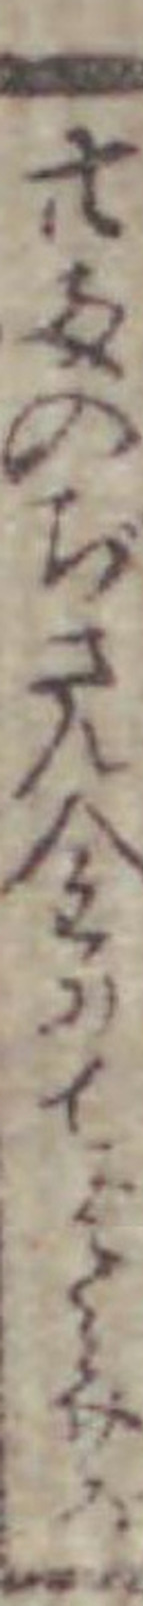大毎のぢさん金にて与之介が
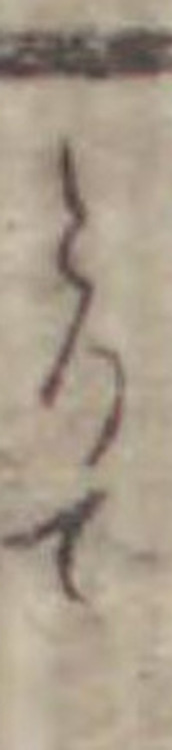とりて
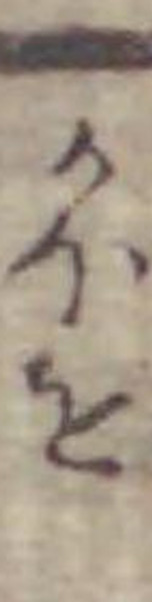かほを
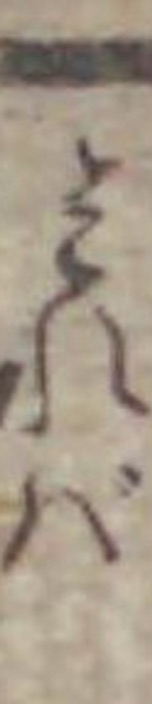みれば
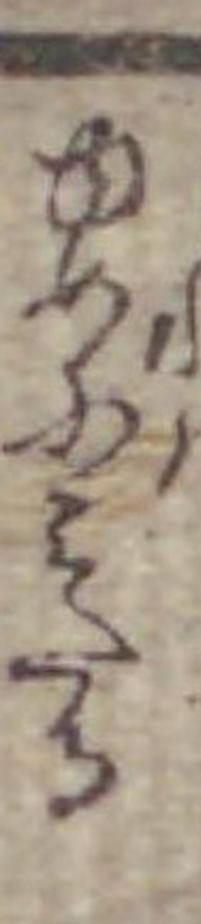ゆめにみたる
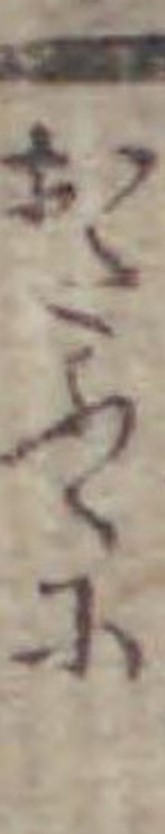おたふくに
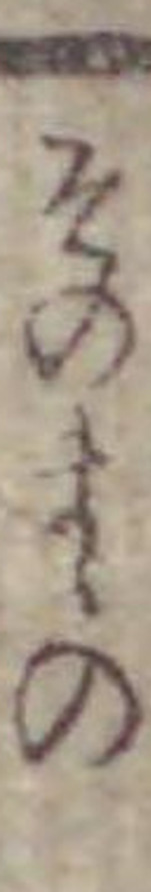そのまゝの
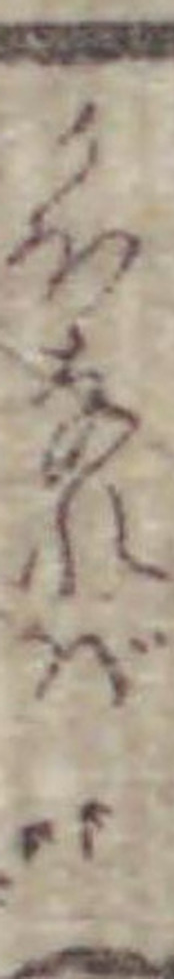かほなれば
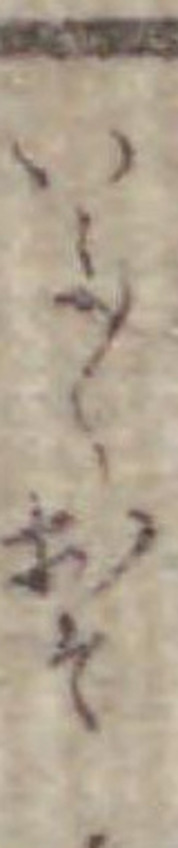いよ〳〵おそ
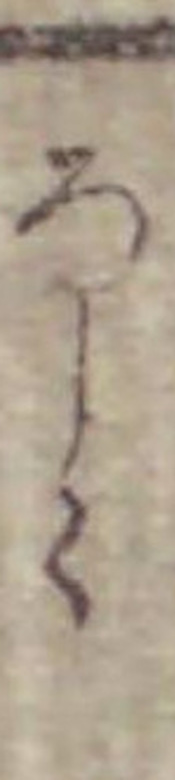ろしく
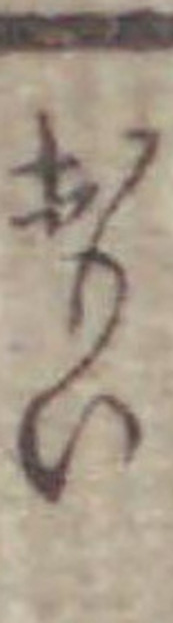おもい

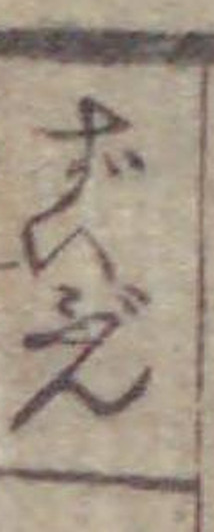ずいぶん
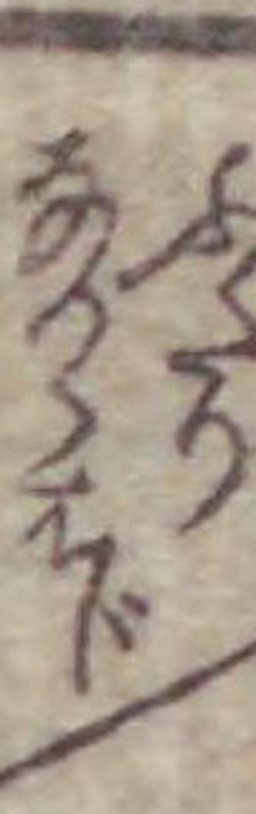ながらはじ
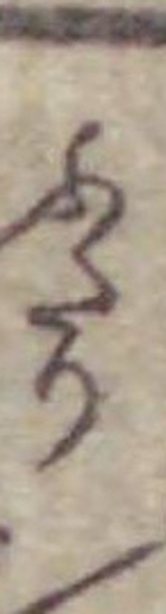ふたり
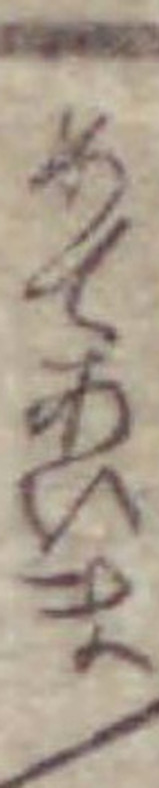めてあいま
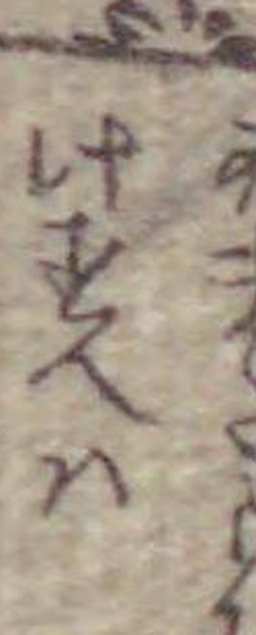此すへは
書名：嗚呼不侭世之助噺 : 3巻
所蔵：国立国会図書館 National Diet Library, JAPAN
